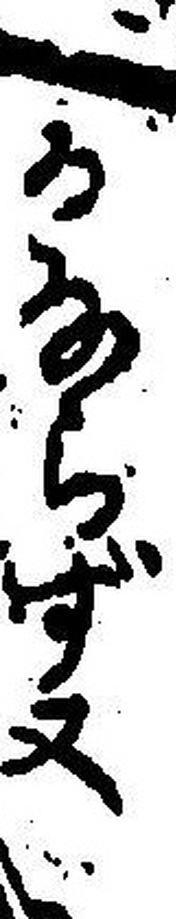かならず又
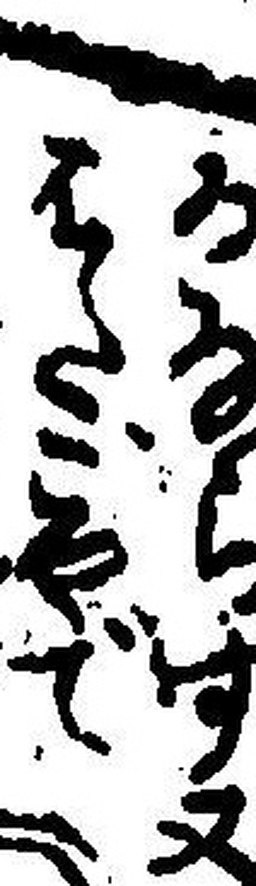はたごやで
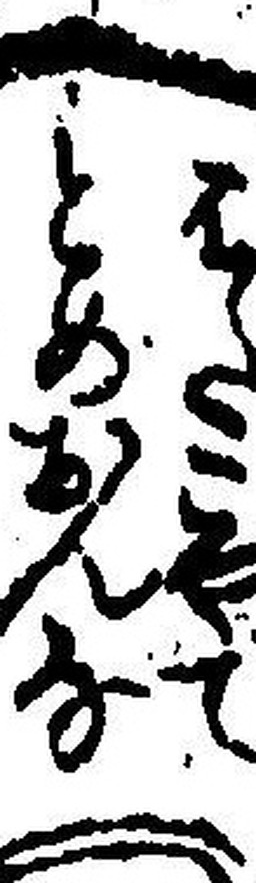とめおんな
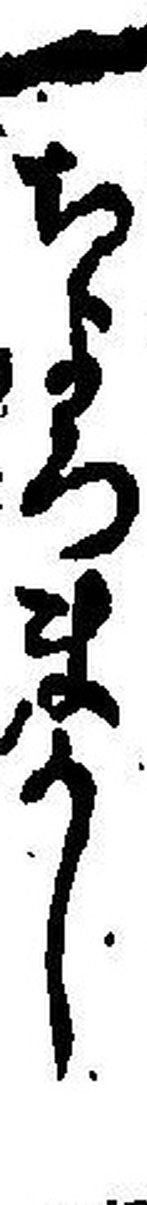ちよろまかし
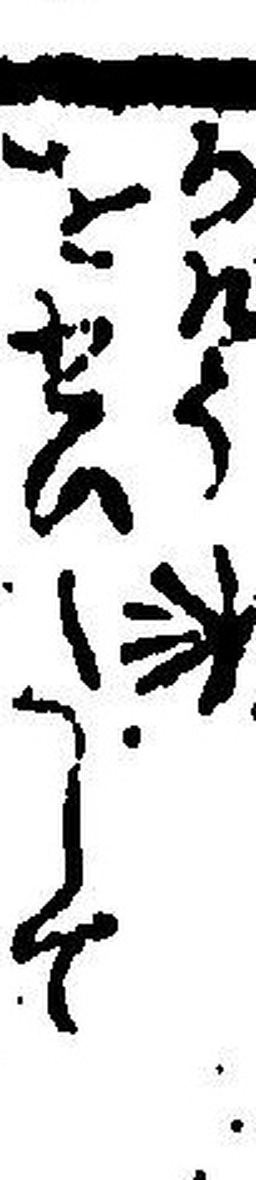をせいたして
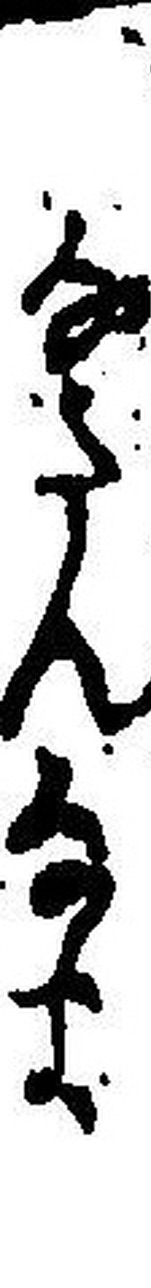なさんなよ
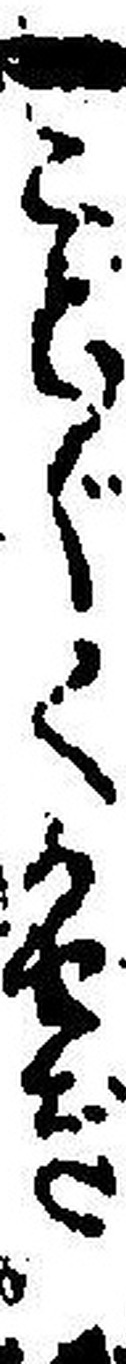こと〴〵くかせぎ
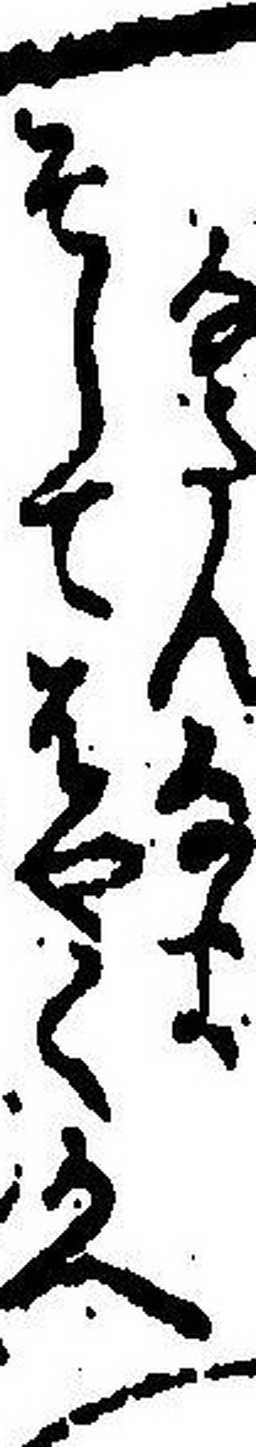そしてはやくかへ
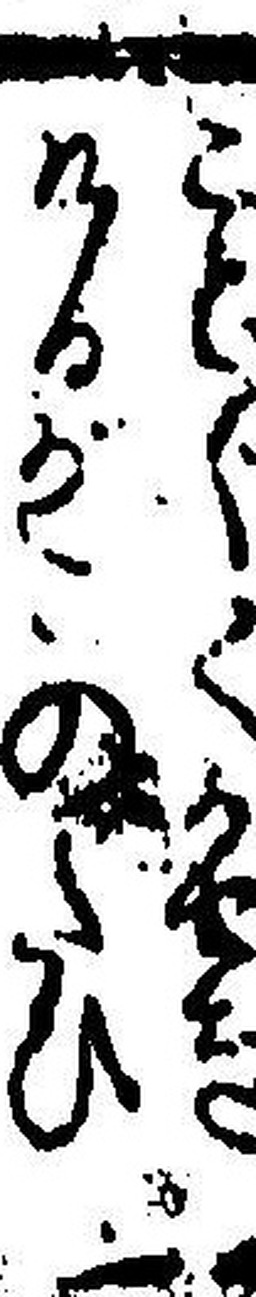けるがこのたひ
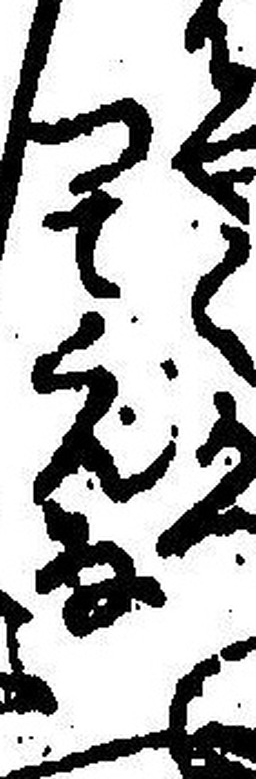つてくんなよ
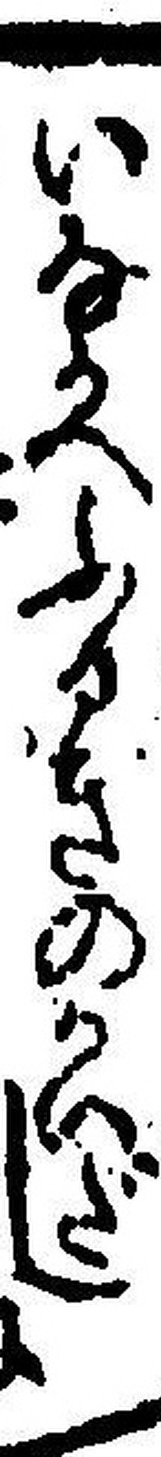いなかへふるきのかいだしに
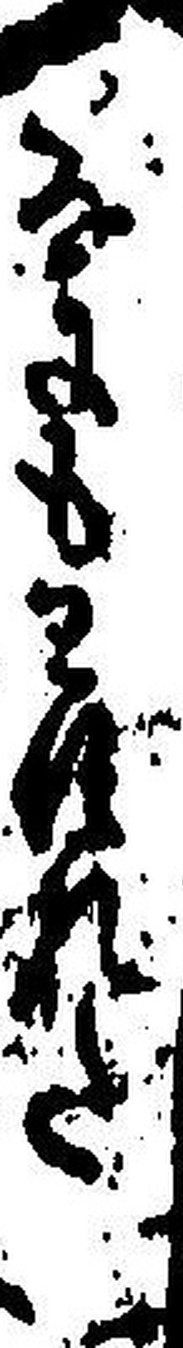なにもわすれた
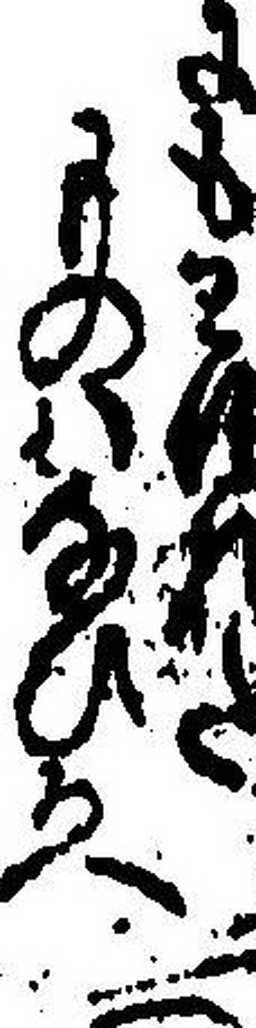ものはなひかへ
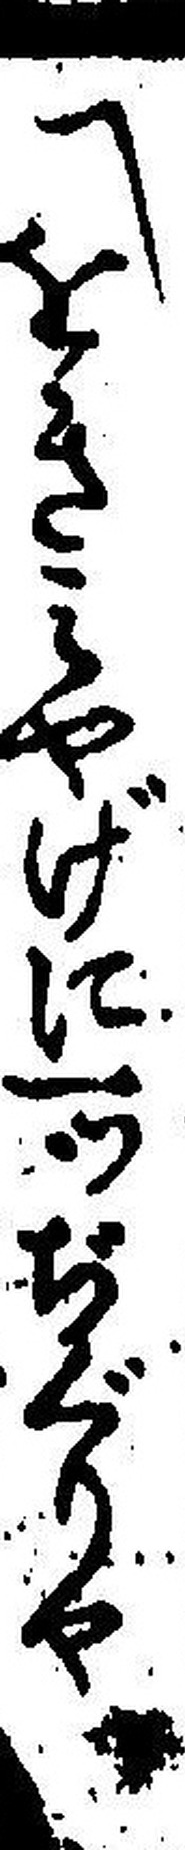〽おきみやげに一つぢぐりや
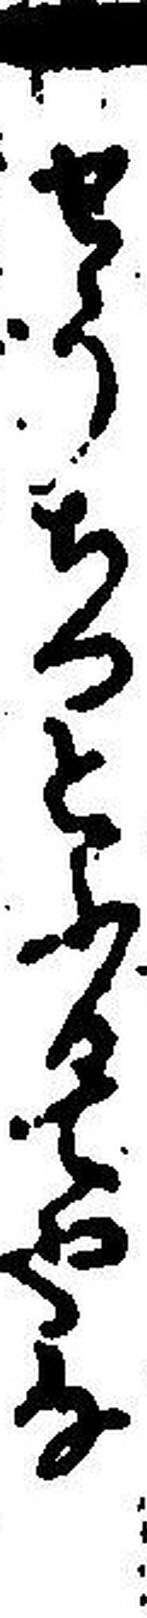せうちつとふるてやな
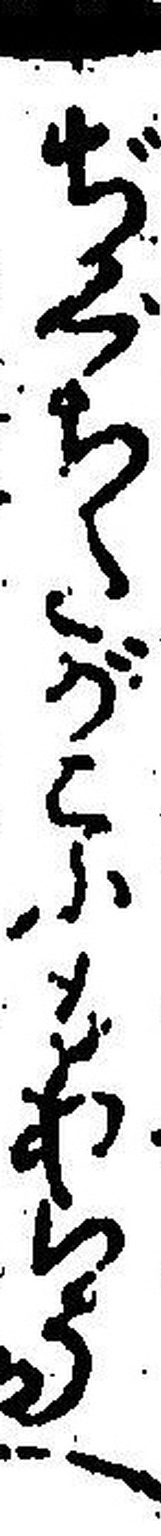ぢぐちたがこふもあらうか
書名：花芳野犬斑 / 山東京伝作
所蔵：東京大学総合図書館 General Library in the University of Tokyo, JAPAN
